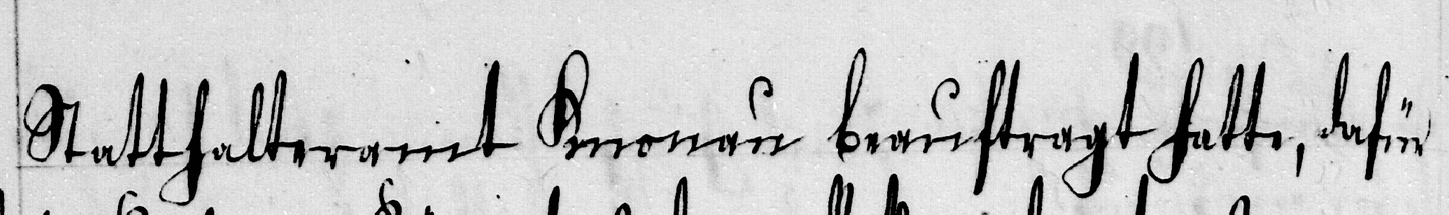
Statthalteramt Knonau beauftragt hatte, daf¬
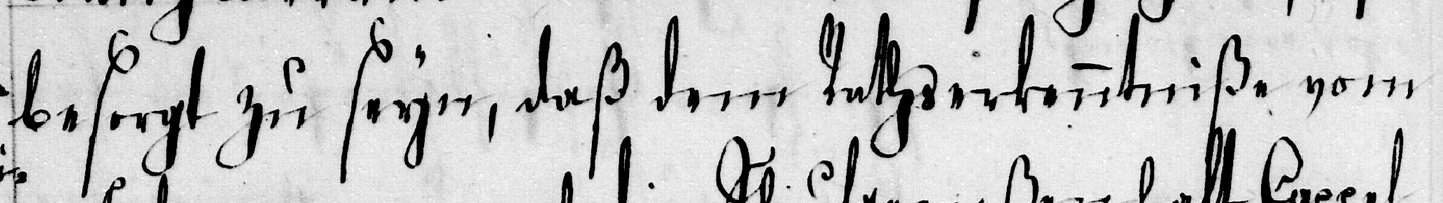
besorgt zu seyn, daß dem Rathserkenntniße vom
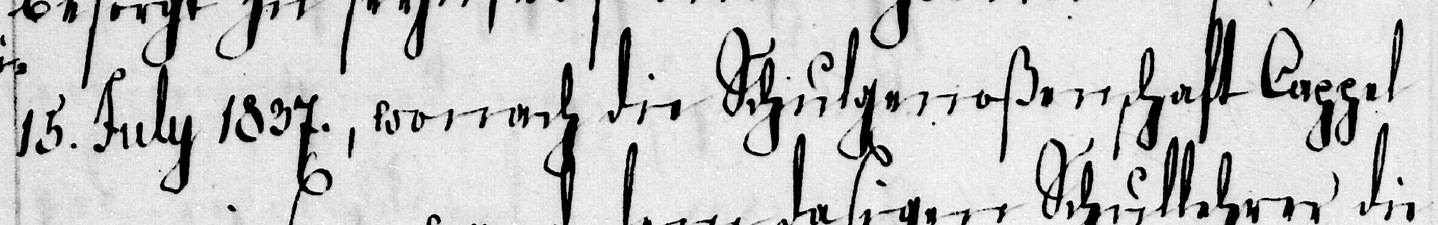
15. July 1837., wonach die Schulgenoßenschaft Cappel
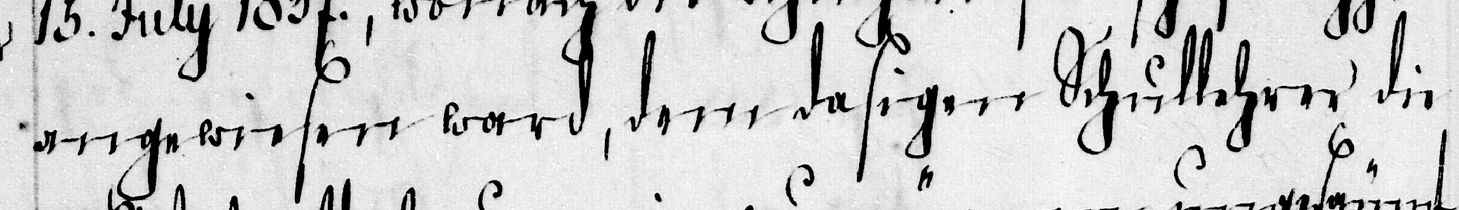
angewiesen ward, dem dasigen Schullehrer die
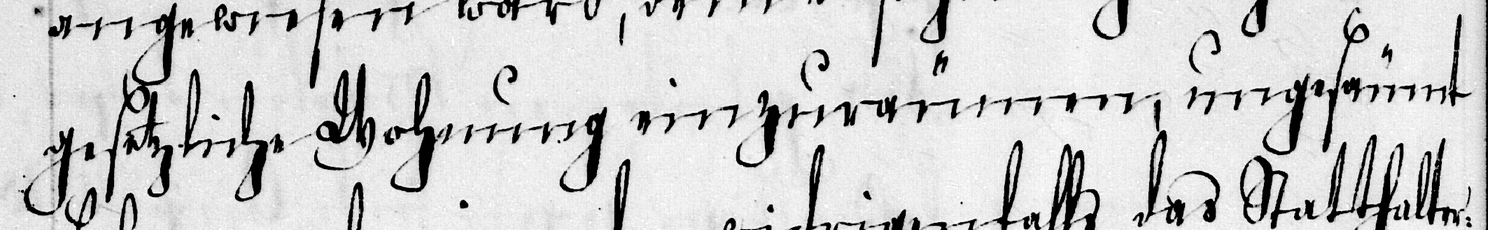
gesetzliche Wohnung einzuräumen, ungesäumt
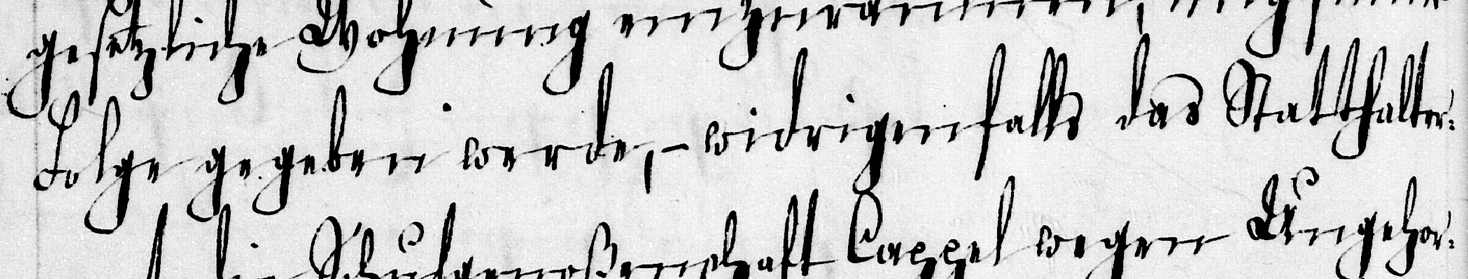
Folge gegeben werde, – widrigenfalls das Statthalt¬
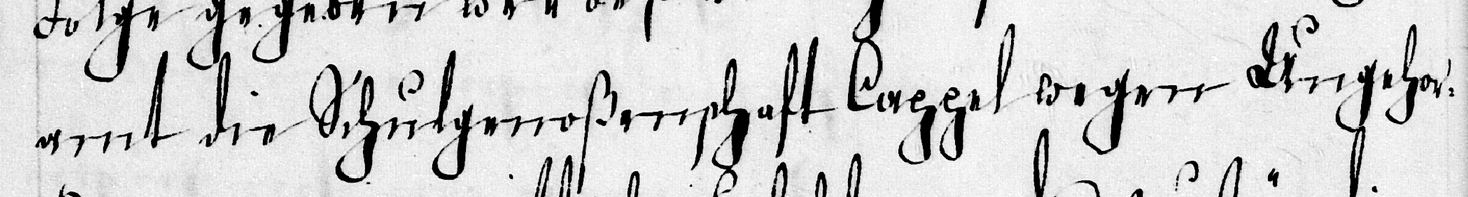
amt die Schulgenoßenschaft Cappel wegen Ungeho¬
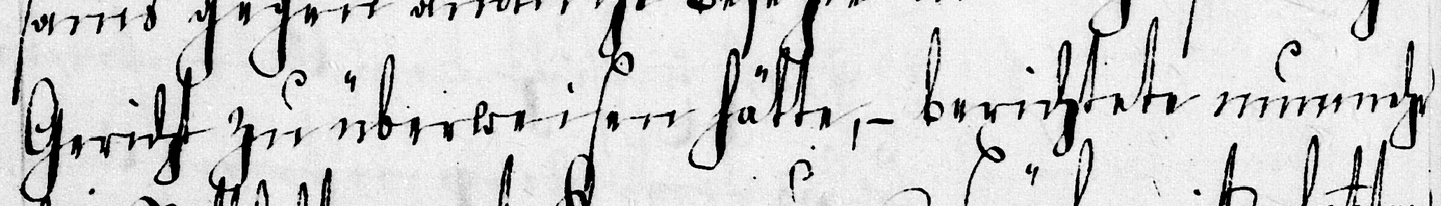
Gericht zu überweisen hätte, – berichtete nunmehr
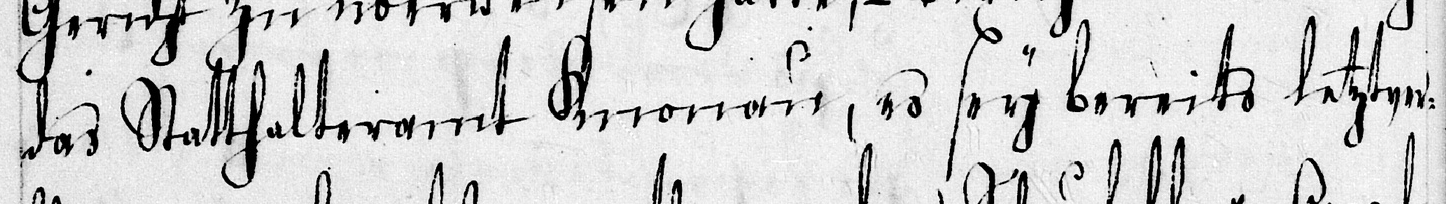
das Statthalteramt Knonau, es sey bereits letzt¬
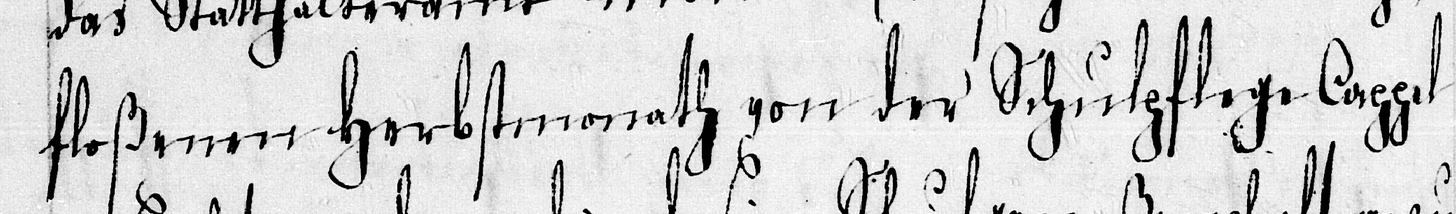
floßenen Herbstmonath von der Schulpflege Capp¬
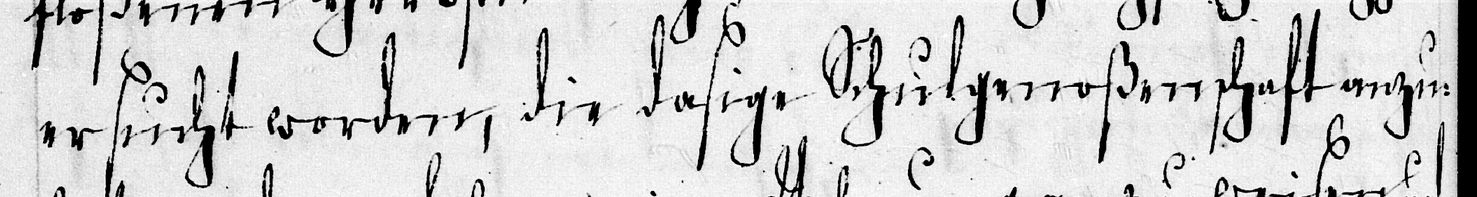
ersucht worden, die dasige Schulgenoßenschaft anzu¬
